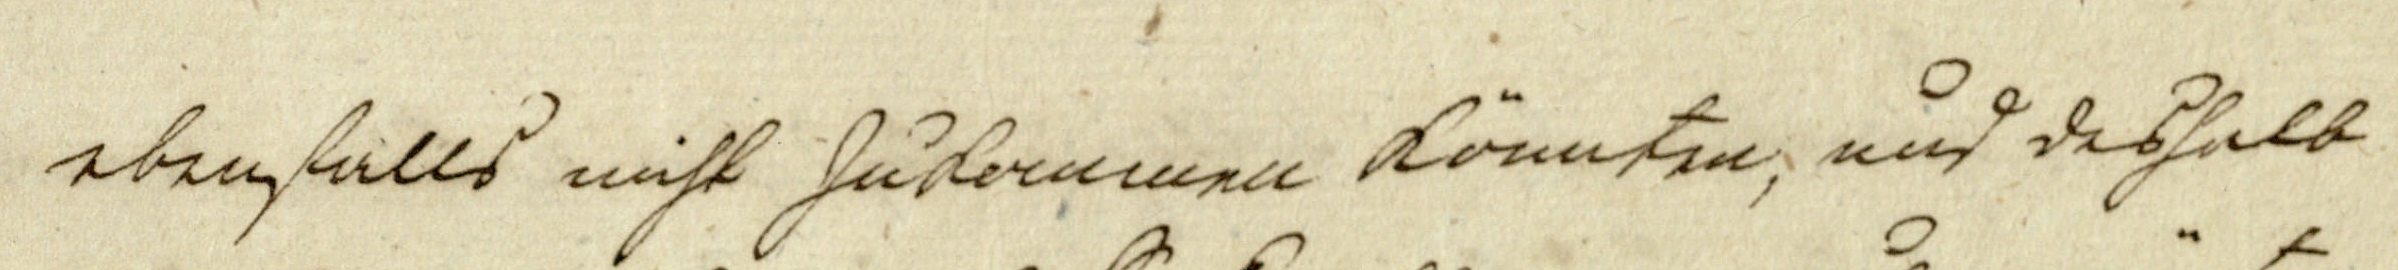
ebenfalls nicht zukommen könnten, und deshalb
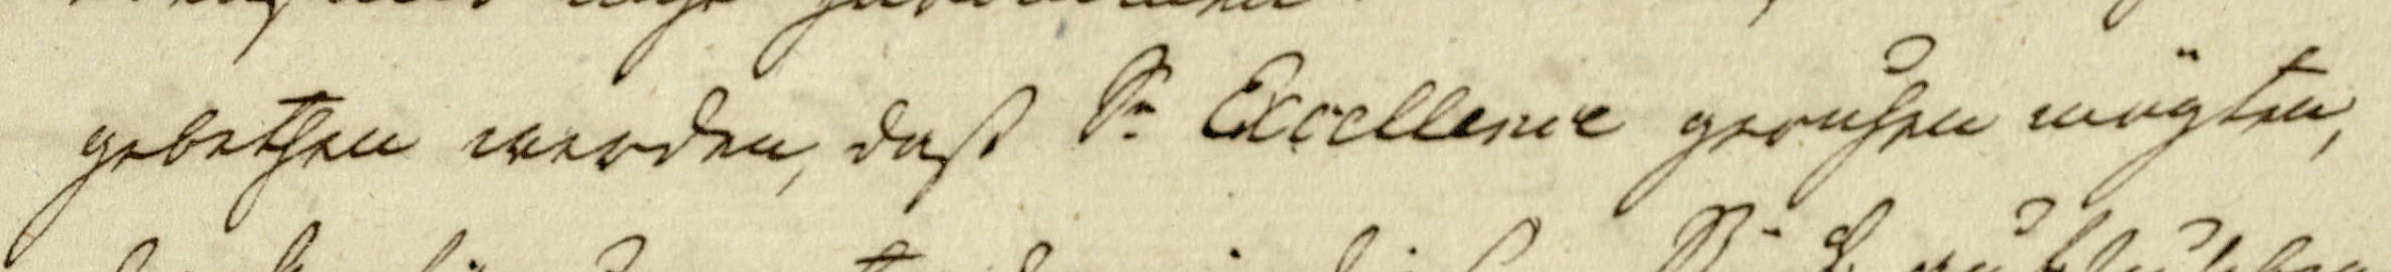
gebethen werden, daß Sr. Excellence geruhen mögten,
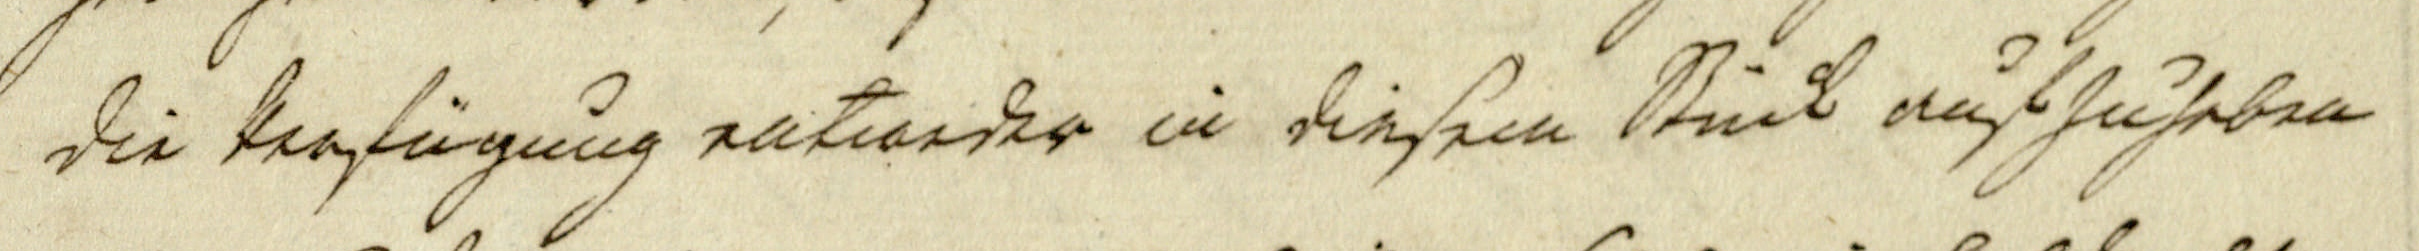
die Verfügung entweder in diesem Stück aufzuheben
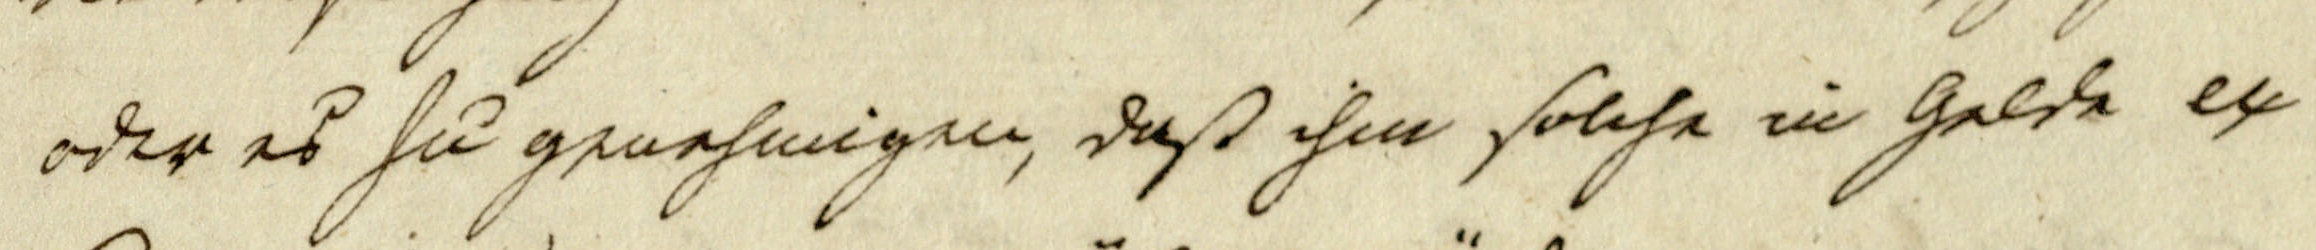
oder es zu genehmigen, daß ihm solche in Gelde ex
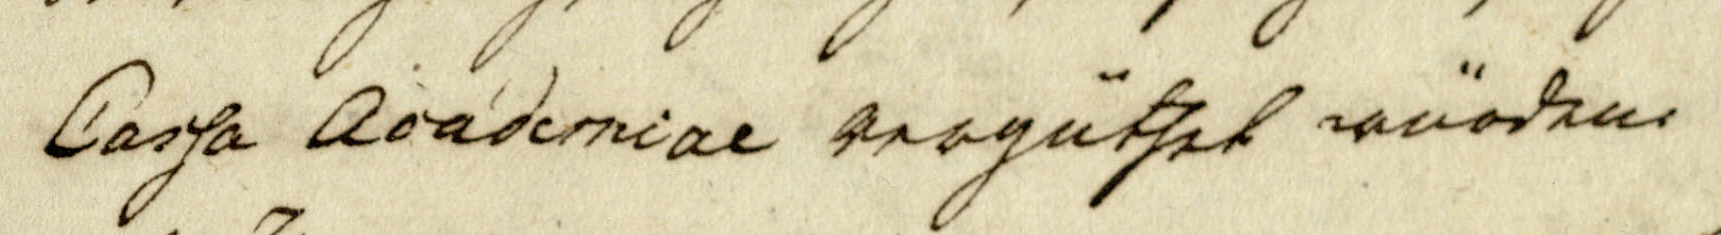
Cassa Academiae vergüthet würden.
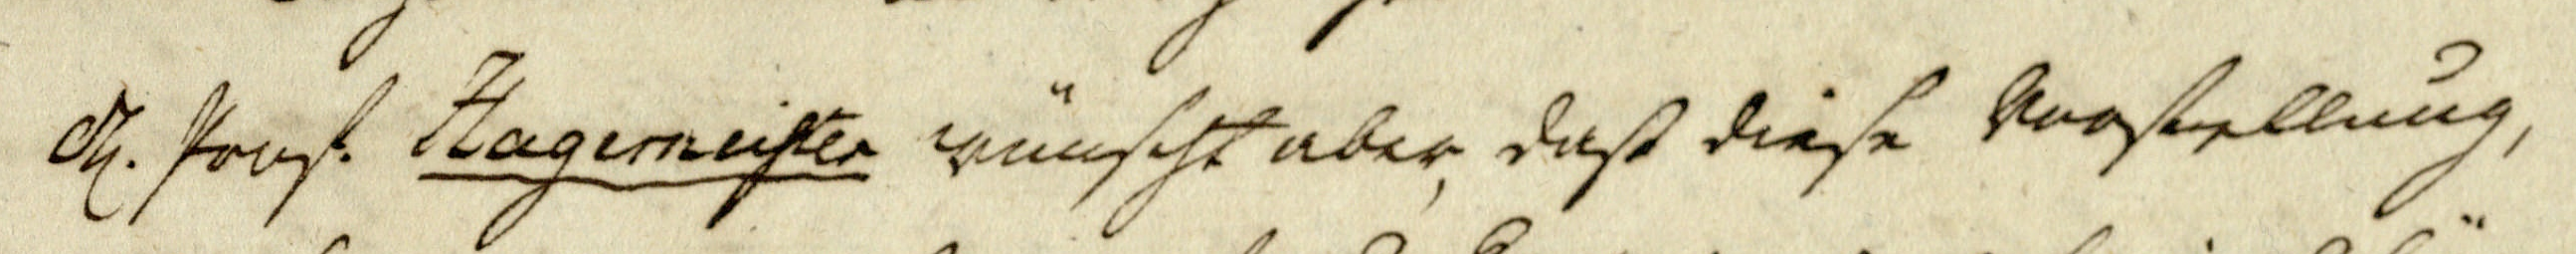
dh. Prof. Hagemeister wünscht aber, daß diese Vorstellung,
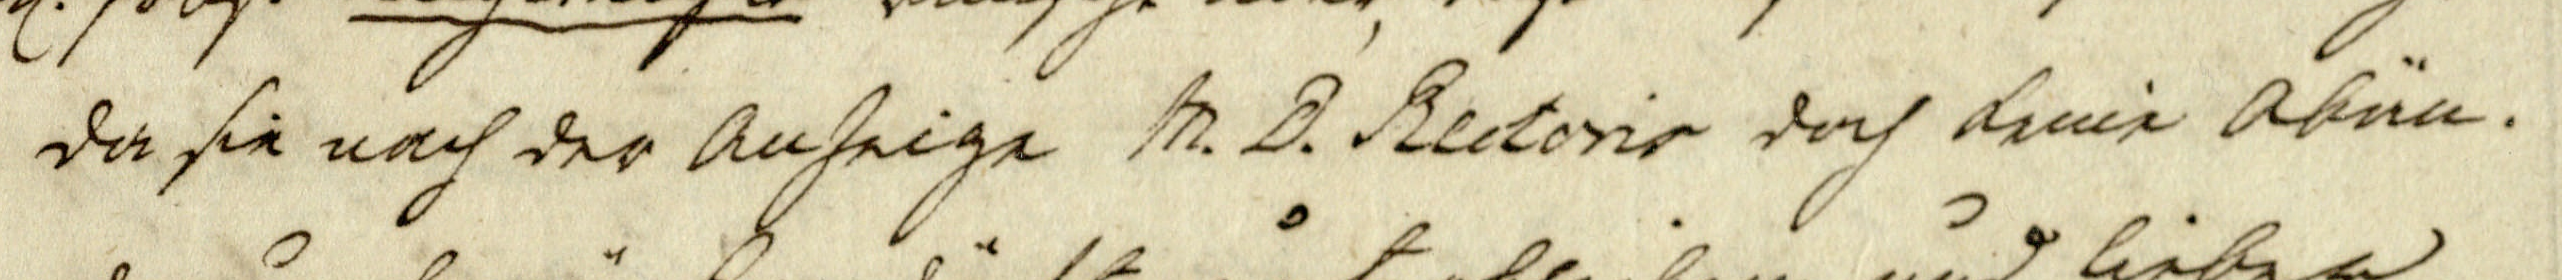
da sie nach der Anzeige M. D. Rectoris doch keine Abän¬
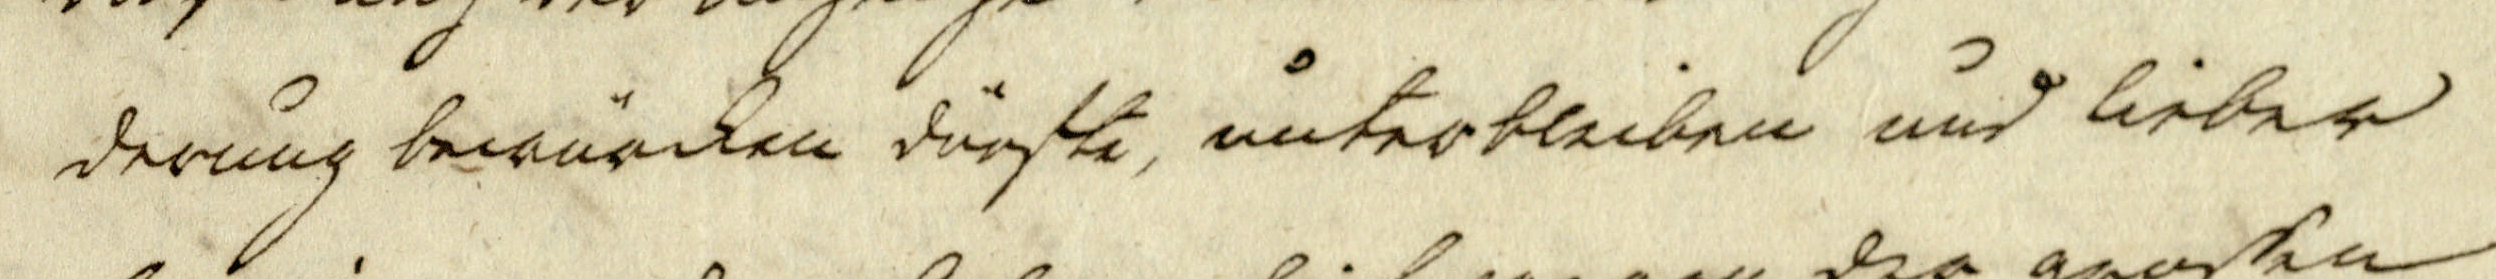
derung bewürcken dürfte, unterbleiben und lieber
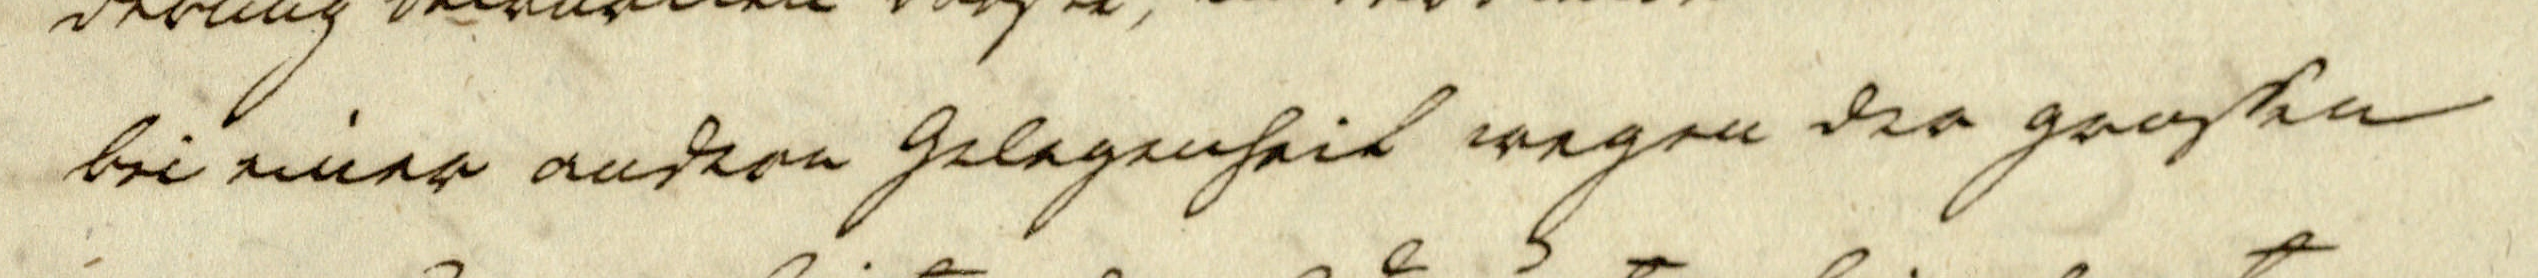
bei einer andern Gelegenheit wegen der großen
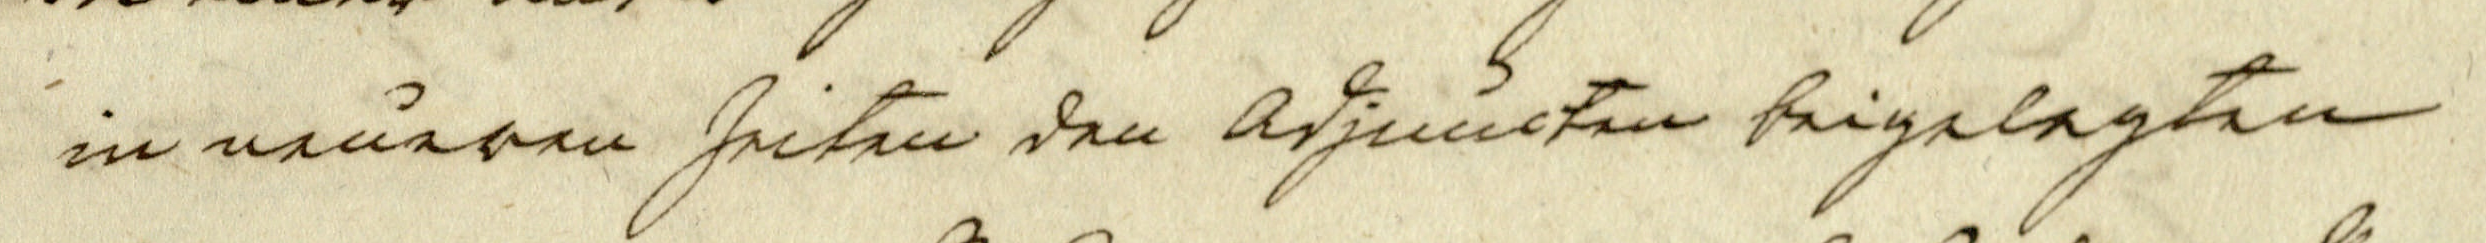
in neueren Zeiten den Adjuncten beigelegten
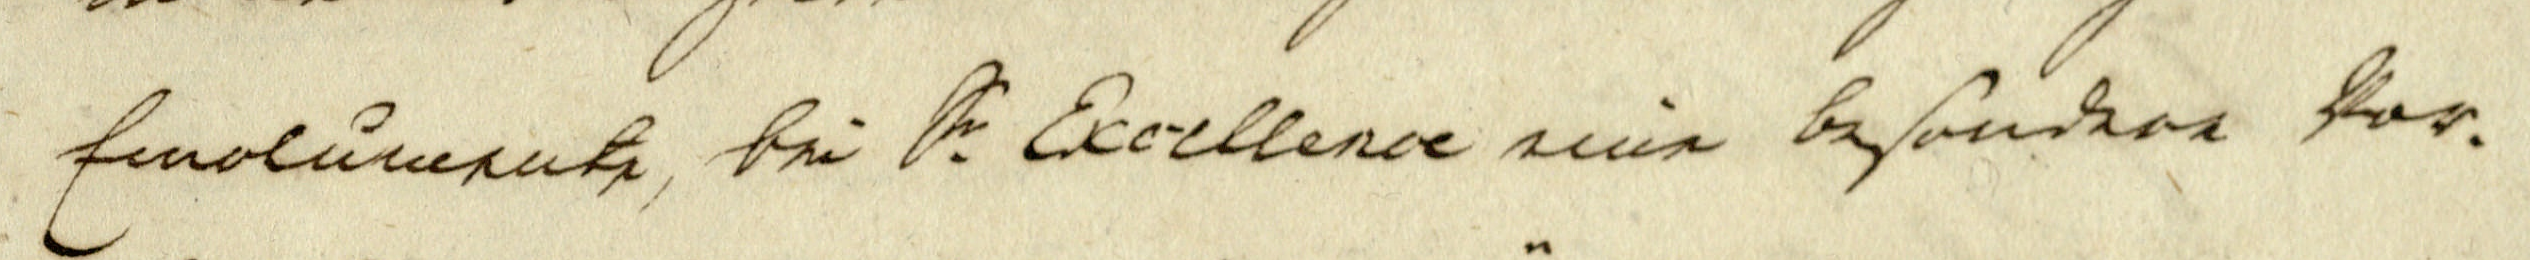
Emolumente, bei Sr. Excellence eine besondere Vor¬
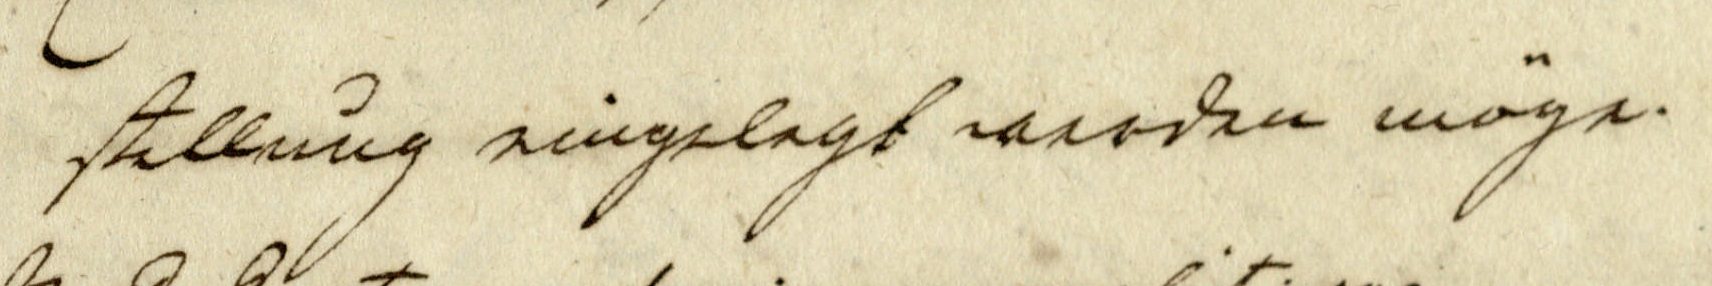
stellung eingelegt werden möge.
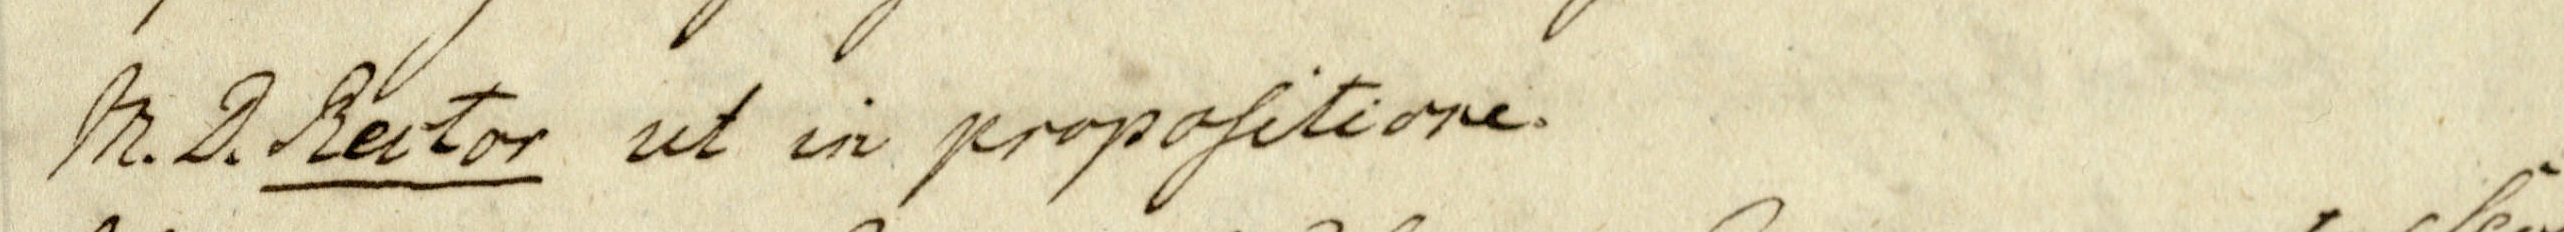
M. D. Rector ut in propositione.
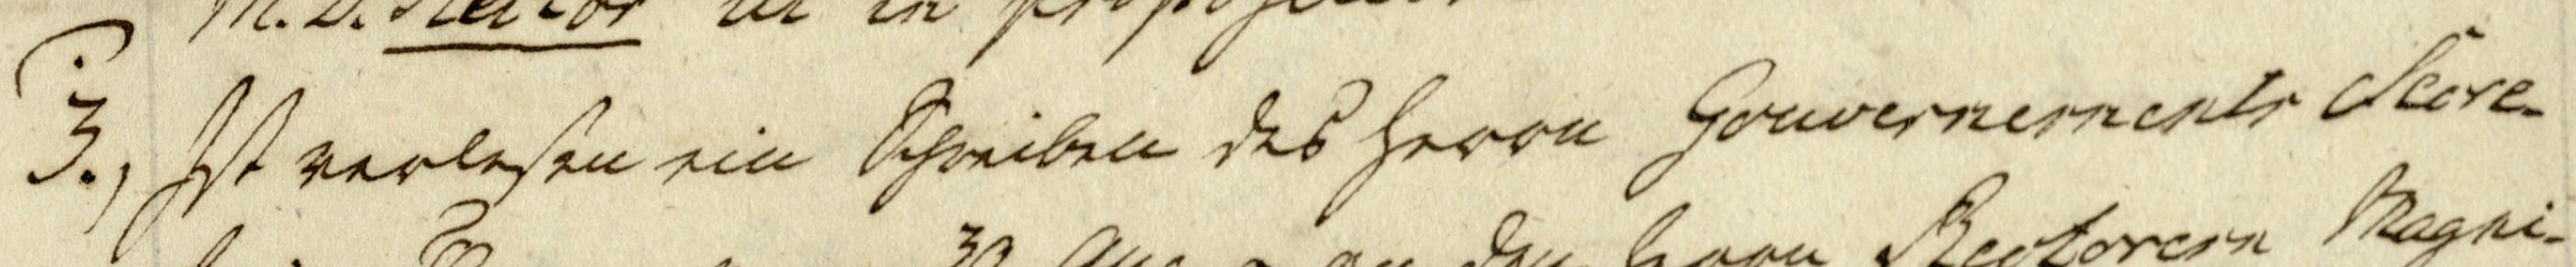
Ist verlesen ein Schreiben des herrn Gouvernements Secre¬
